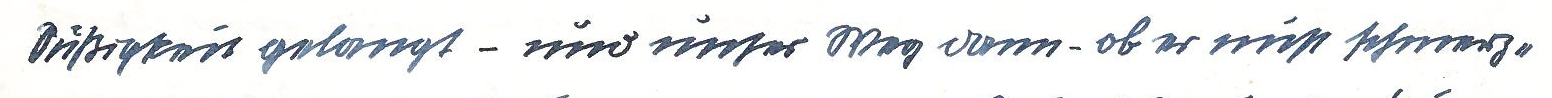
Süßigkeit gelangt – und unser Weg dann – ob er nicht schmerz¬
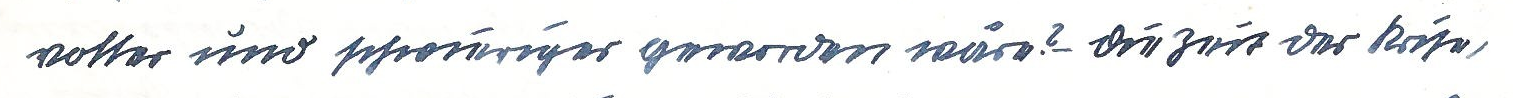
voller und schwieriger geworden wäre? – Die Zeit der Krise,
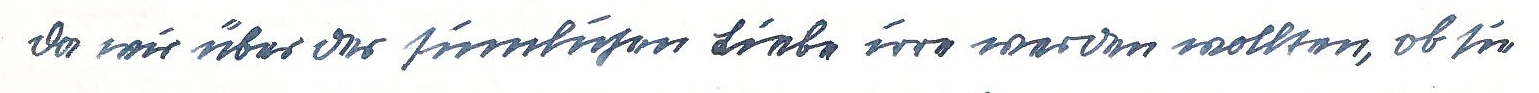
da wir über der sinnlichen Liebe irre werden wollten, ob sie
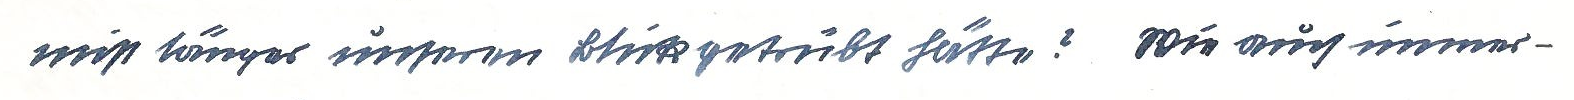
nicht länger unseren Blick getrübt hätte? Wie auch immer –
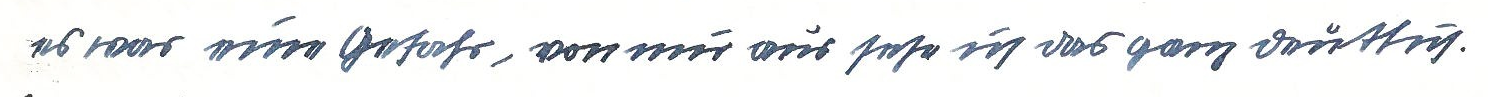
es war eine Gefahr, von mir aus sehe ich das ganz deutlich.
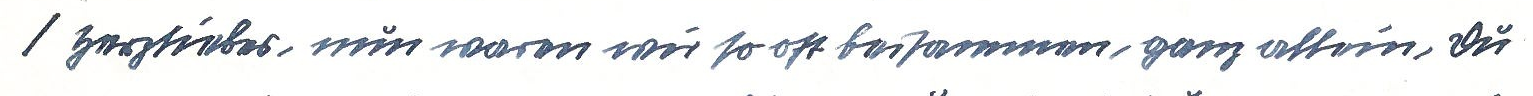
/ Herzliebes, nun waren wir so oft beisammen, ganz allein, Du
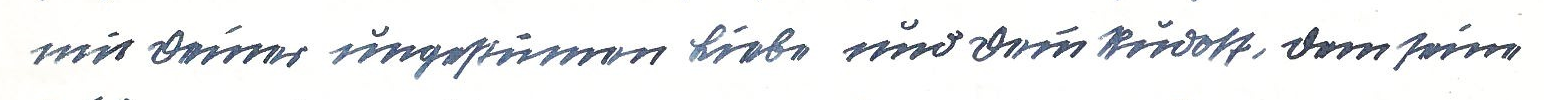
mit Deiner ungestümen Liebe und Dein , dem seine
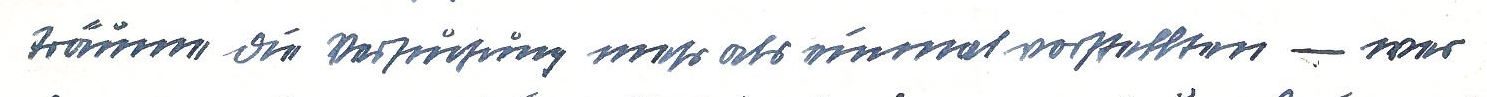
Träume die Versuchung mehr als einmal vorstellten — wer
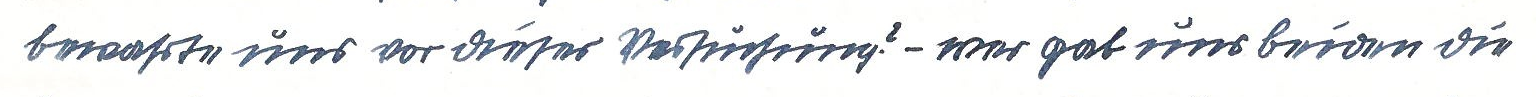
bewahrte uns vor dieser Versuchung? – wer gab uns beiden die
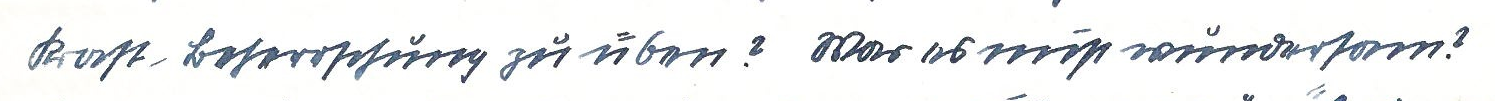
Kraft, Beherrschung zu üben? War es nicht wundersam?
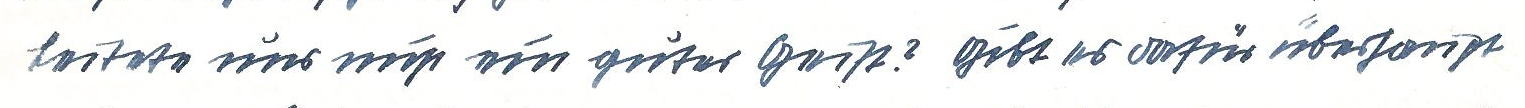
Leitete uns nicht ein guter Geist? Gibt es dafür überhaupt
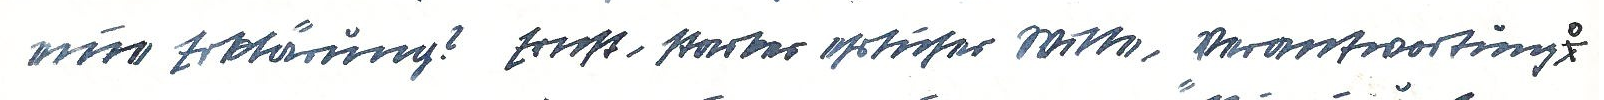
eine Erklärung? Ernst, starker ehrlicher Wille, Verantwortung ,-.
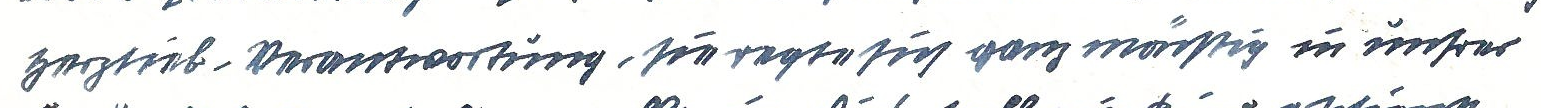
Herzlieb, Verantwortung, sie regte sich ganz mächtig in unsrer
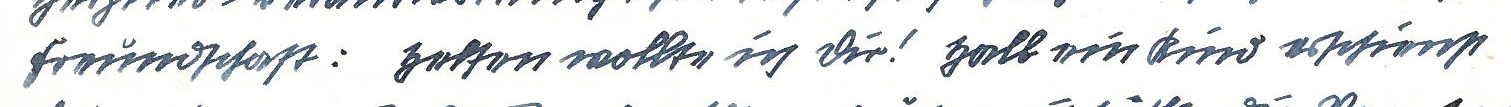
Freundschaft: Helfen wollte ich Dir! Halb ein Kind erschienst
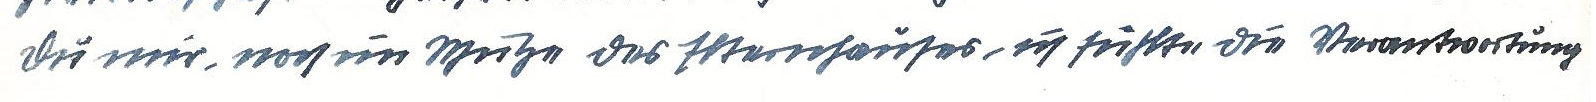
Du mir, noch im Schutze des Elternhauses, ich fühlte die Verantwortung
